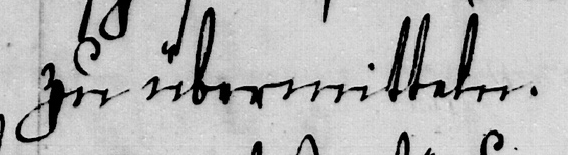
zu übermitteln.
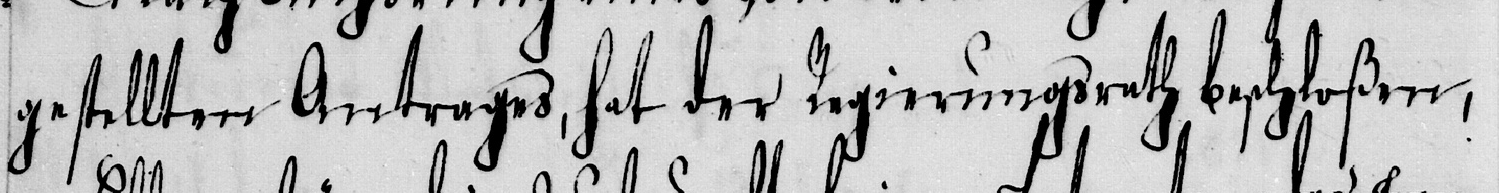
estellten Antrages, hat der Regierungsrath beschloßen,
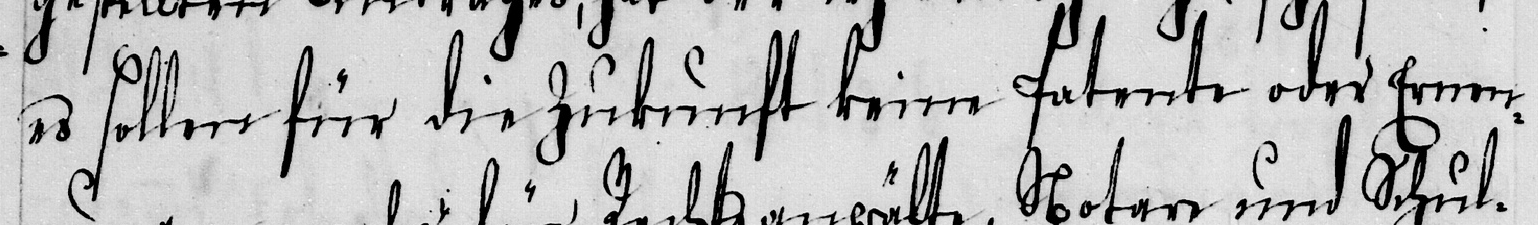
es sollen für die Zukunft keine Patente oder Ernen¬
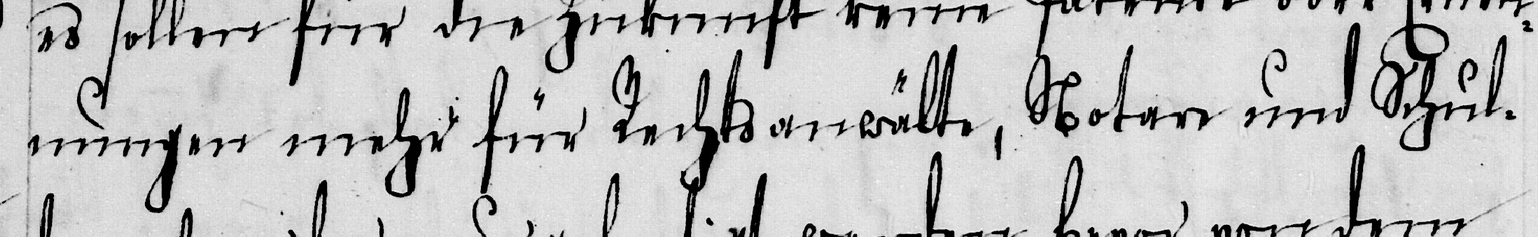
nungen mehr für Rechtsanwälte, Notare und Schul¬
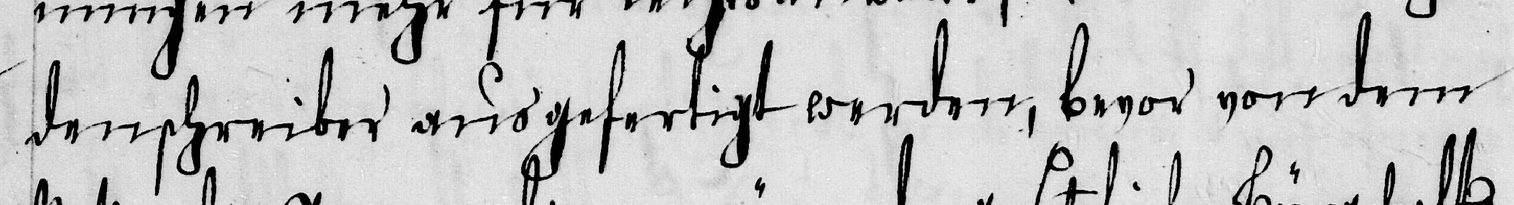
denschreiber ausgefertigt werden, bevor von dem
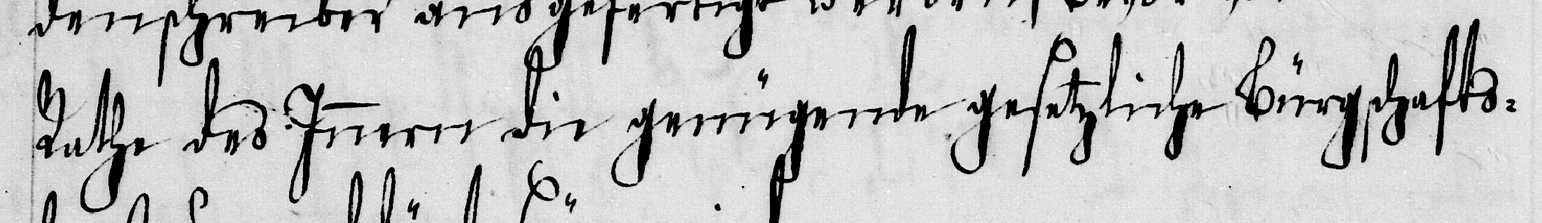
Rathe des Innern die genügende gesetzliche Bürgschafts¬
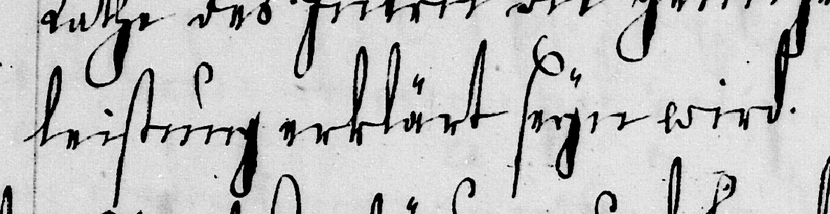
leistung erklärt seyn wird.
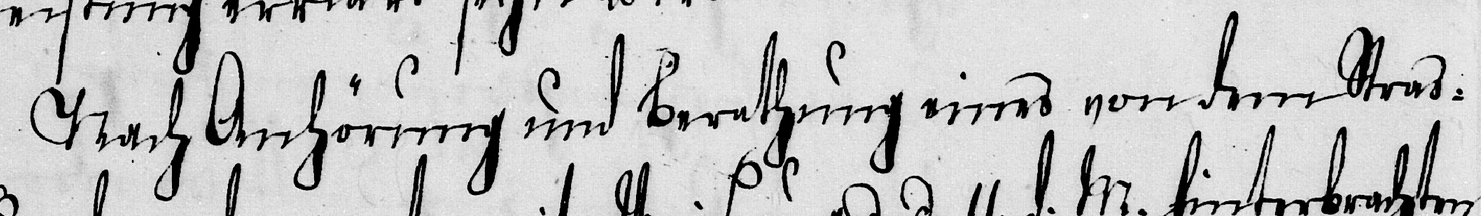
Nach Anhörung und Berathung eines von dem Straß¬
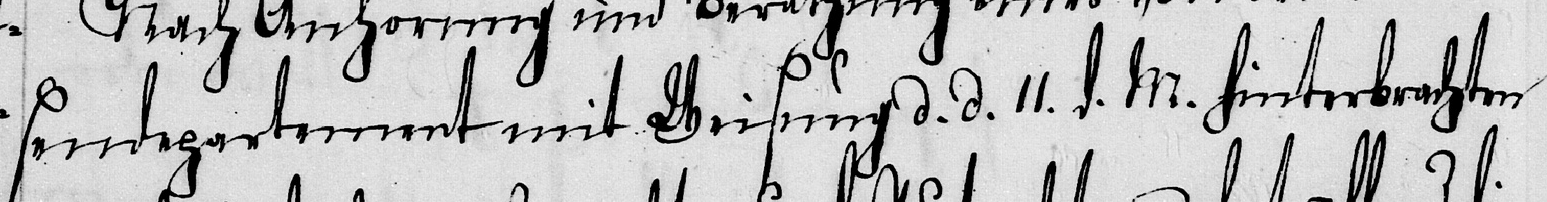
endepartement mit Weisung d. d. 11. d. M. hinterbrachten
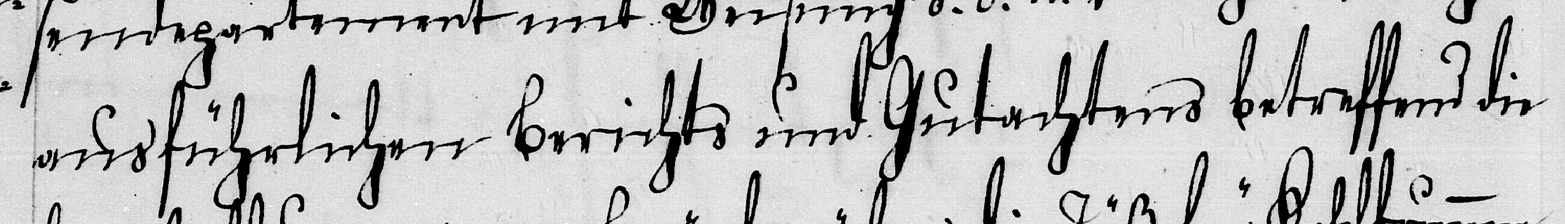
ausführlichen Berichts und Gutachtens betreffend
